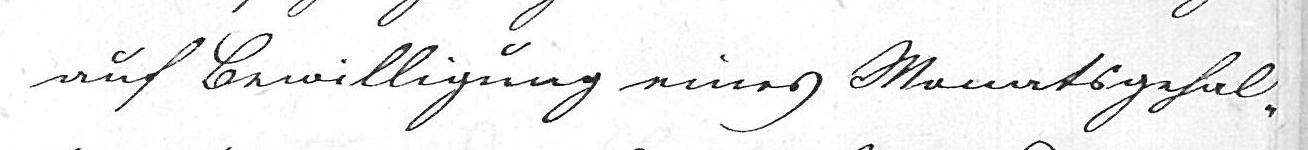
auf Bewilligung eines Monatsgehal-
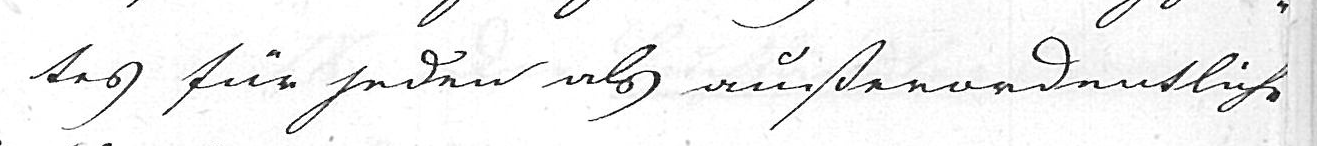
tes für jeden als außerordentliche
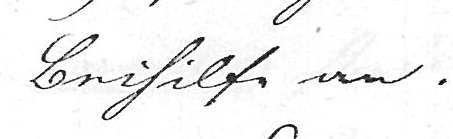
Beihilfe an.
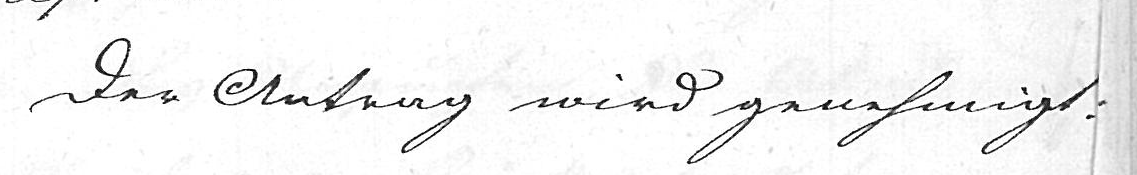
Der Antrag wird genehmigt.
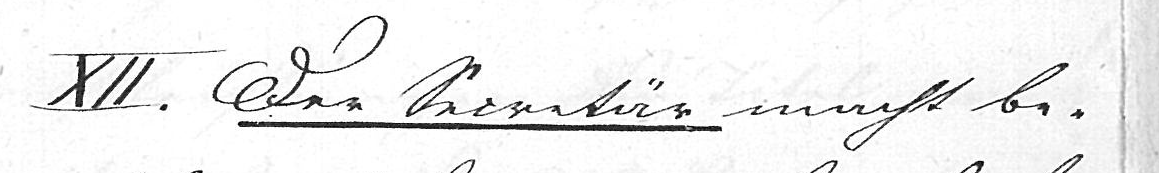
XII. Der Secretär macht be-
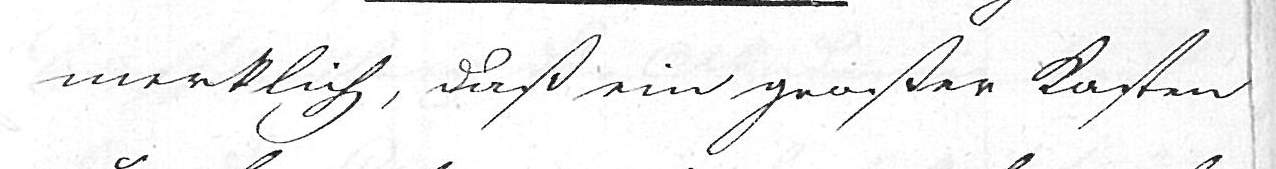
merklich, daß ein großer Kasten
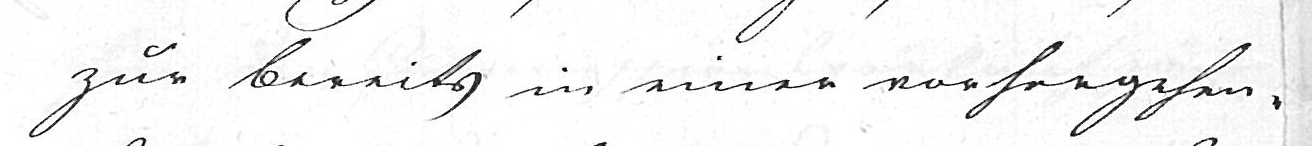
zur bereits in einer vorhergehen-
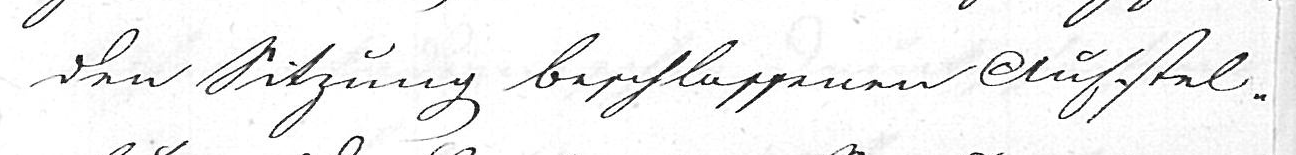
den Sitzung beschlossnen Aufstel-
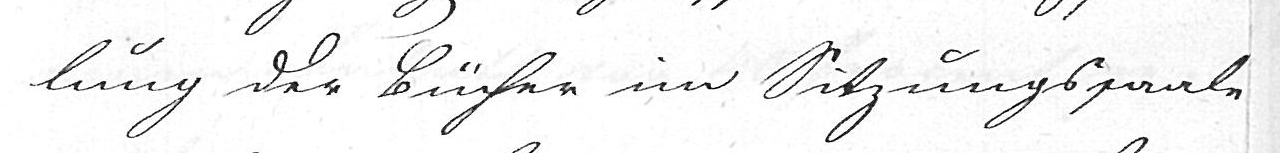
lung der Bücher im Sitzungssaale
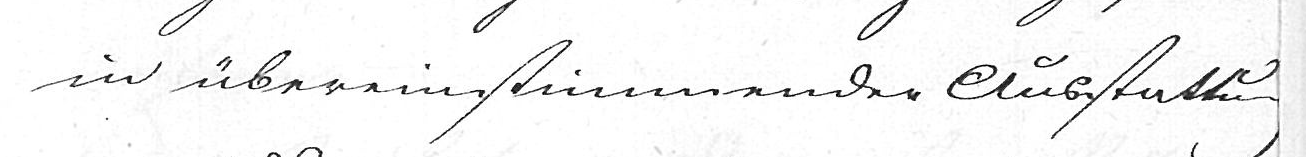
in übereinstimmender Ausstattung
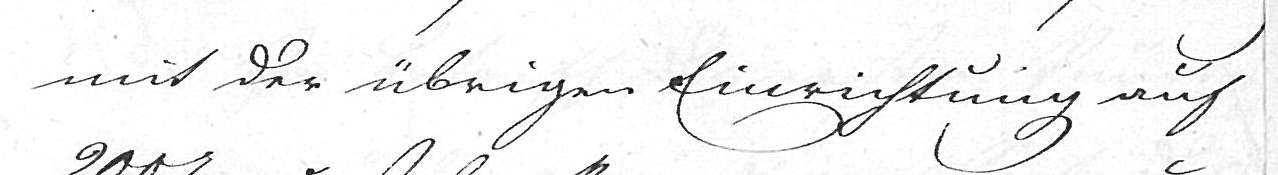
mit der übrigen Einrichtung auf
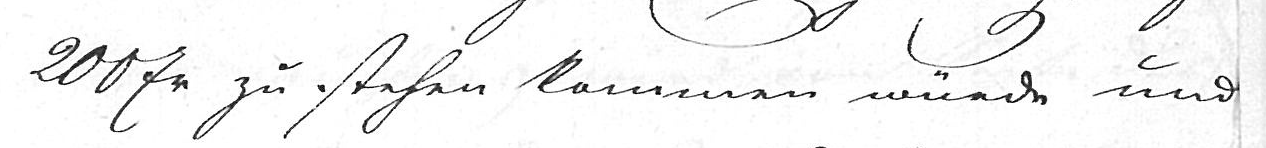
200 fr zu stehen kommen würde und
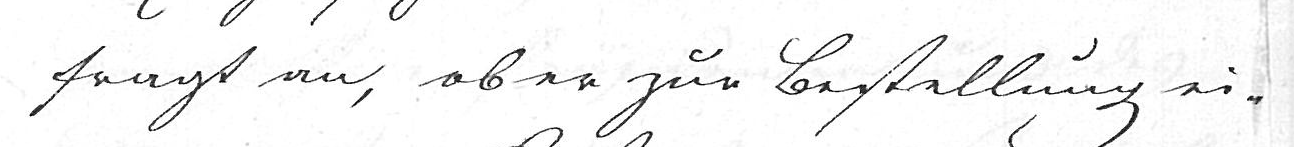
fragt an, ob er zur Bestellung ei-
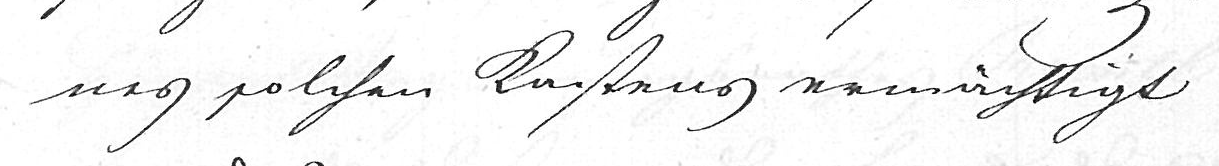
nes solchen Kastens ermächtigt
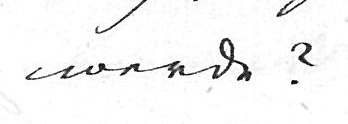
werde?
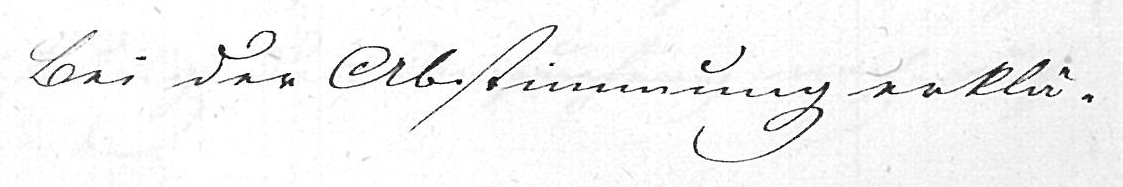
Bei der Abstimmung erklä-
